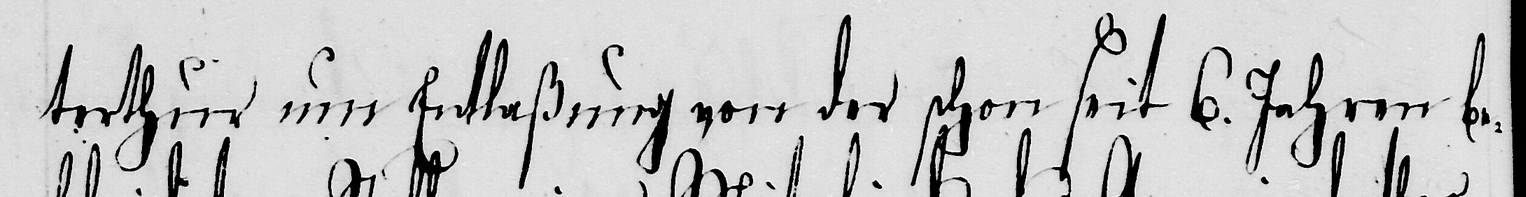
terthur um Entlaßung von der schon seit 6. Jahren be¬
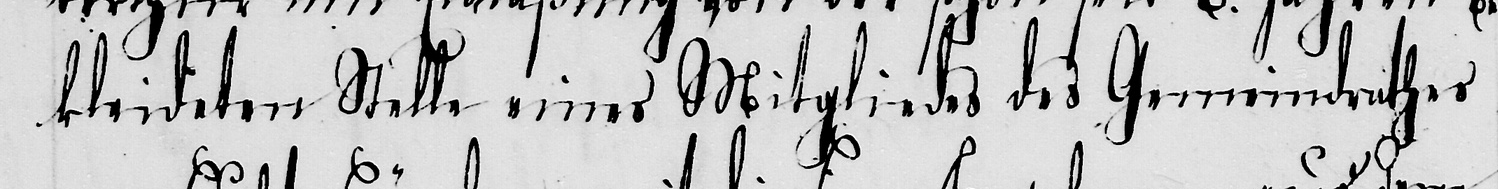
kleideten Stelle eines Mitgliedes des Gemeindrathes
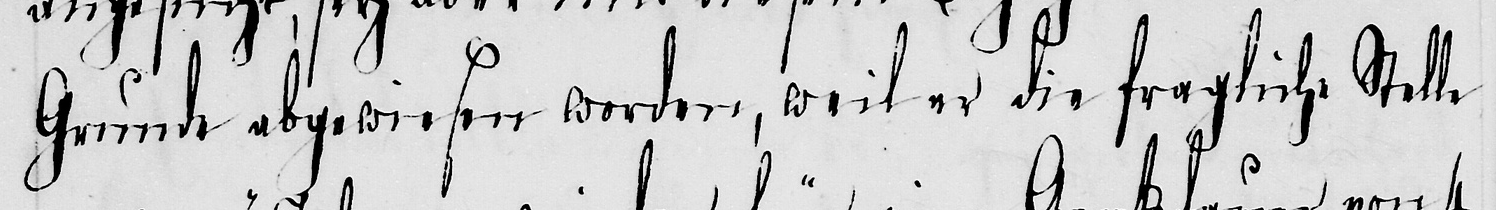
Grunde abgewiesen worden, weil er die fragliche Stel¬
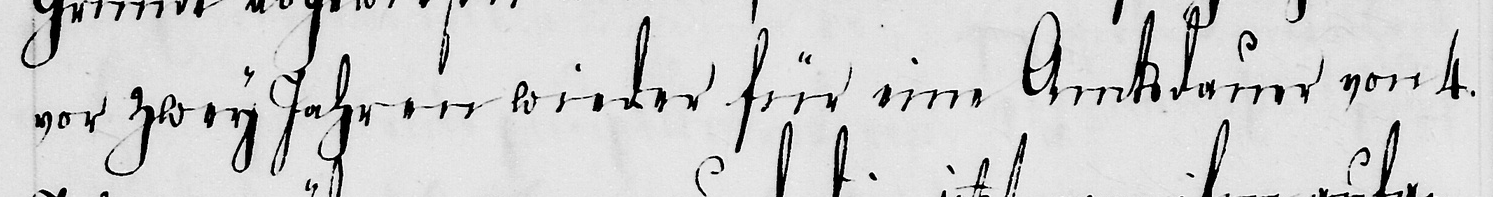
vor zwey Jahren wieder für eine Amtsdauer von 4.
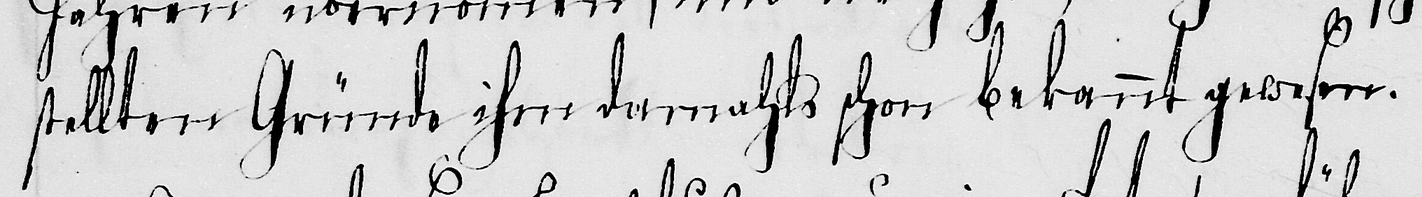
tellten Gründe damahls schon bekannt gewesen.
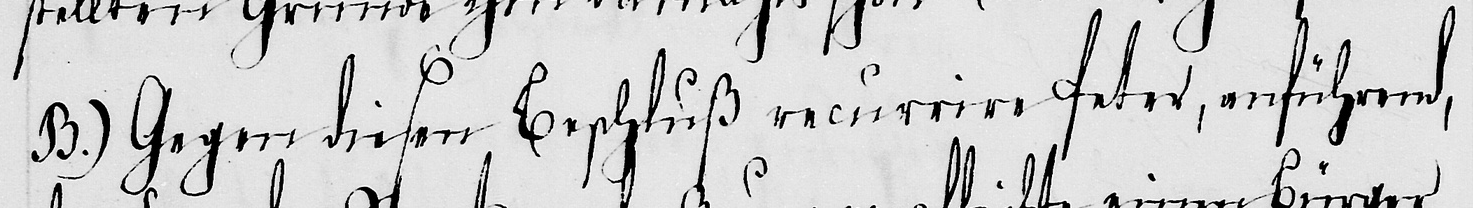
B.) Gegen diesen Beschluß recurrire Peter, anführend,
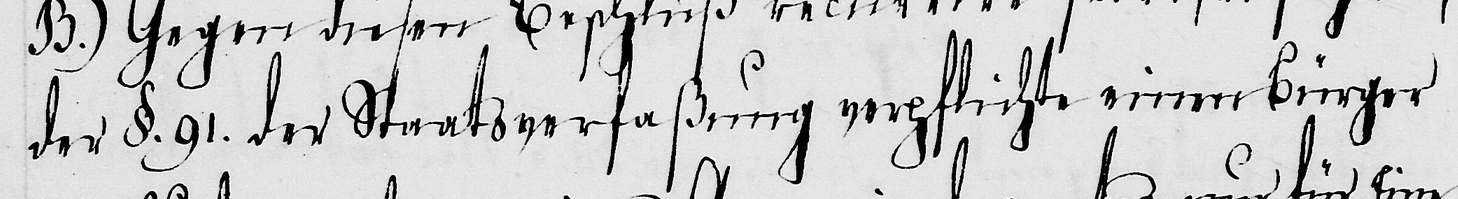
der §. 91. der Staatsverfaßung verpflichte einen Bürger
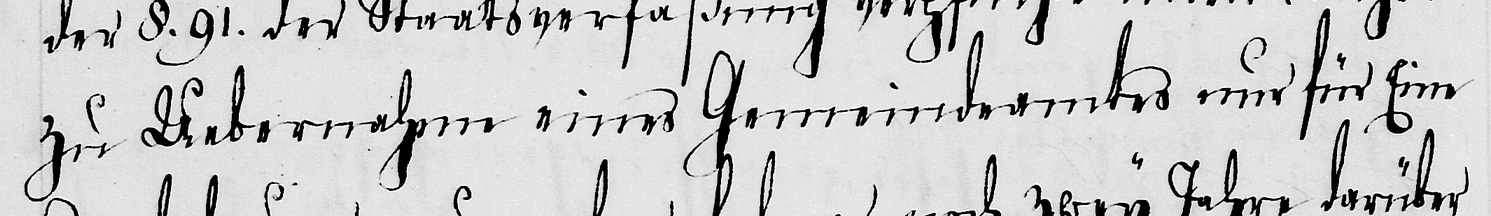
zu Uebernahme eines Gemeindeamtes nur für Eine
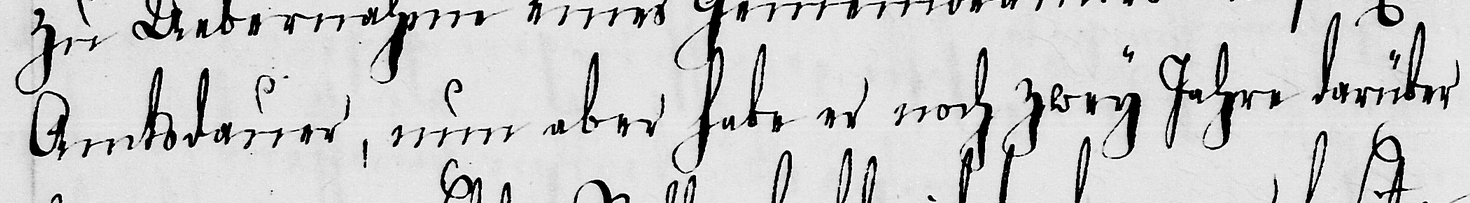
Amtsdauer, nun aber habe er noch zwey Jahre darüber
